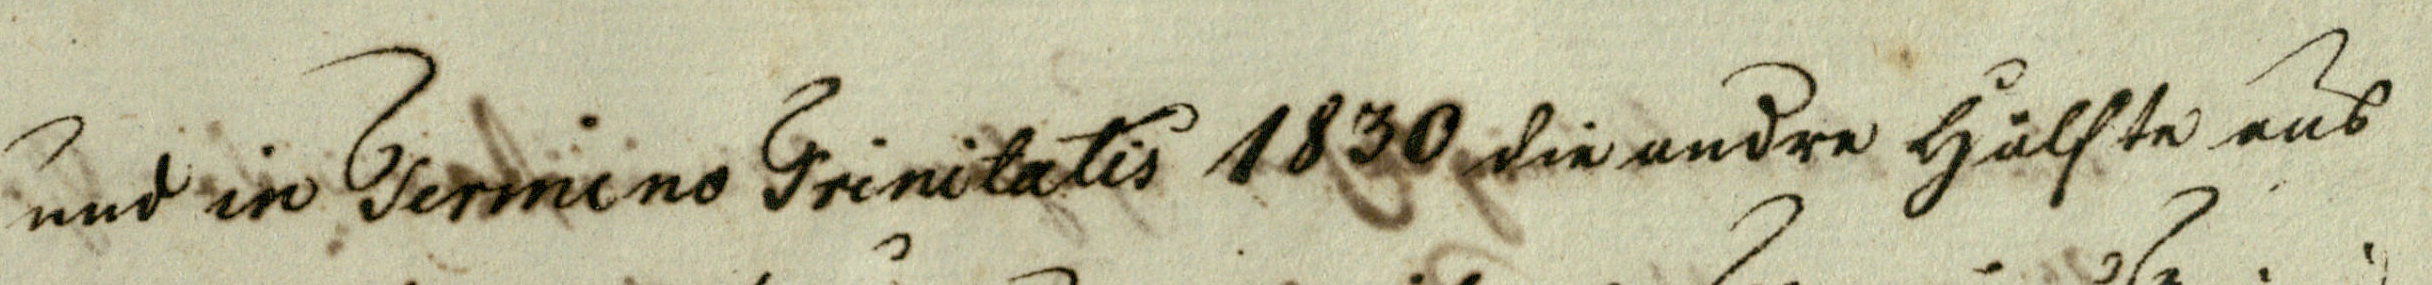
und in Termino Trinitatis 1830 die andere Hälfte aus
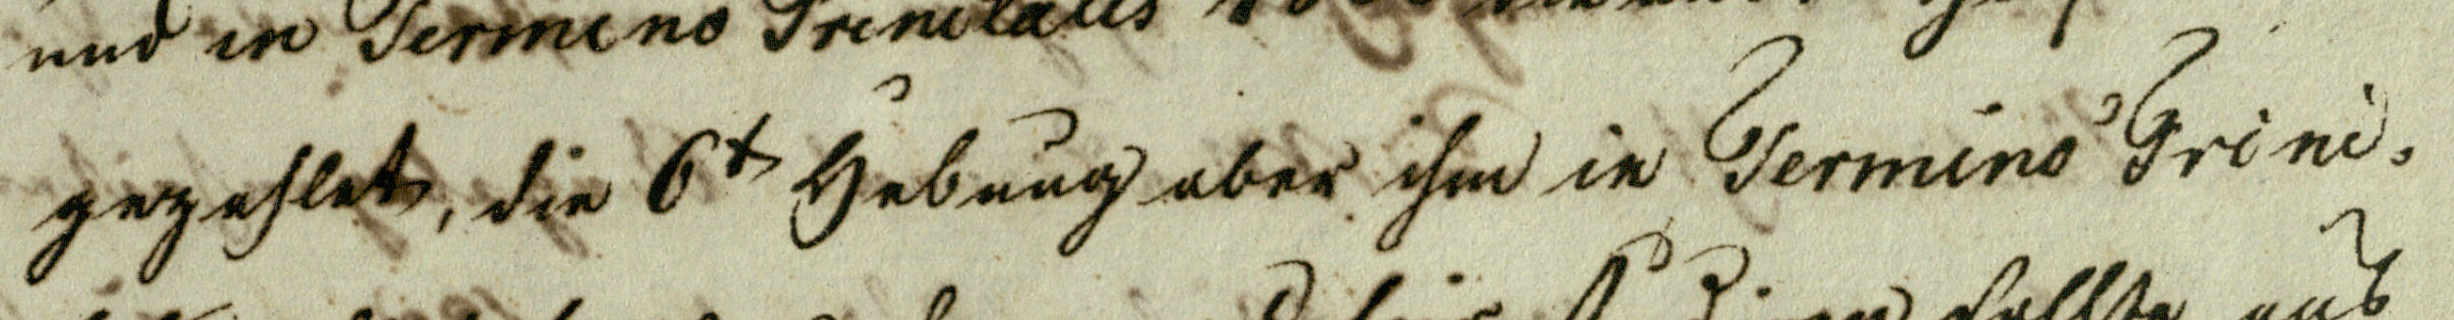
gezahlet, die 6 te Hebung aber ihm in Termino Trini¬
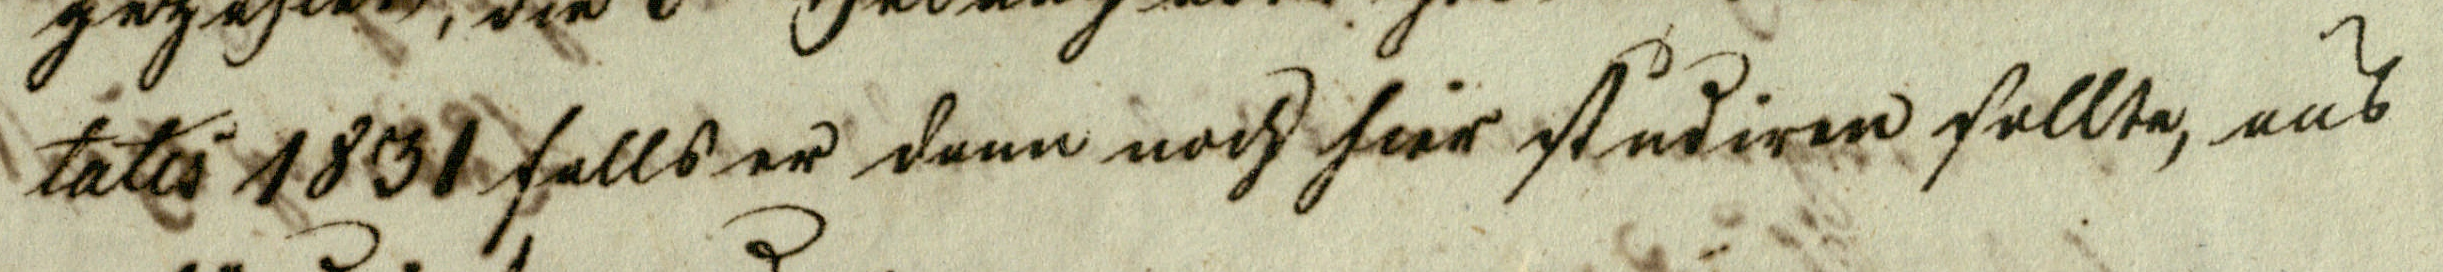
tatis 1831 falls er dann noch hier studiren sollte, aus
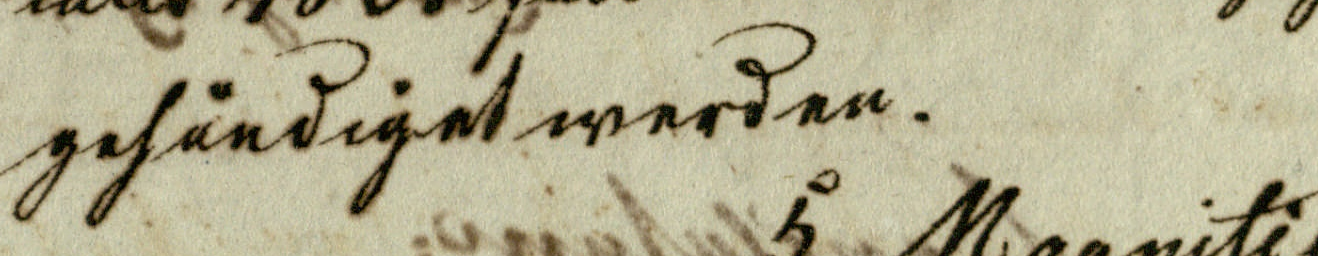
gehändiget werden.
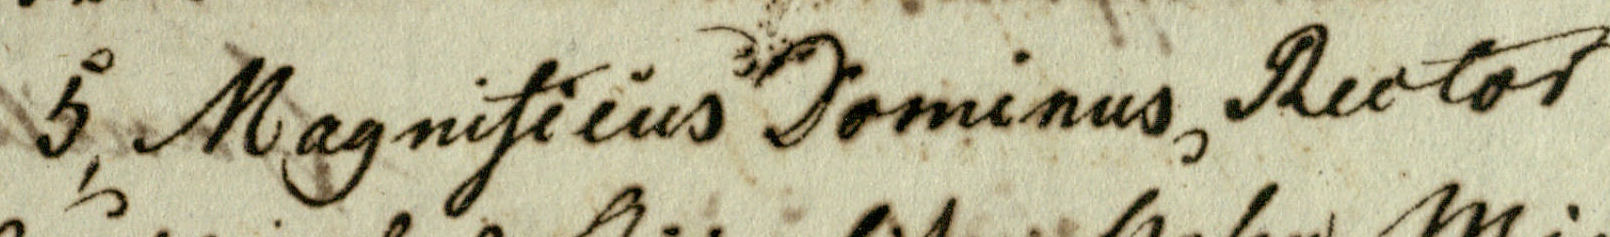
5, Magnificus Dominus Rector
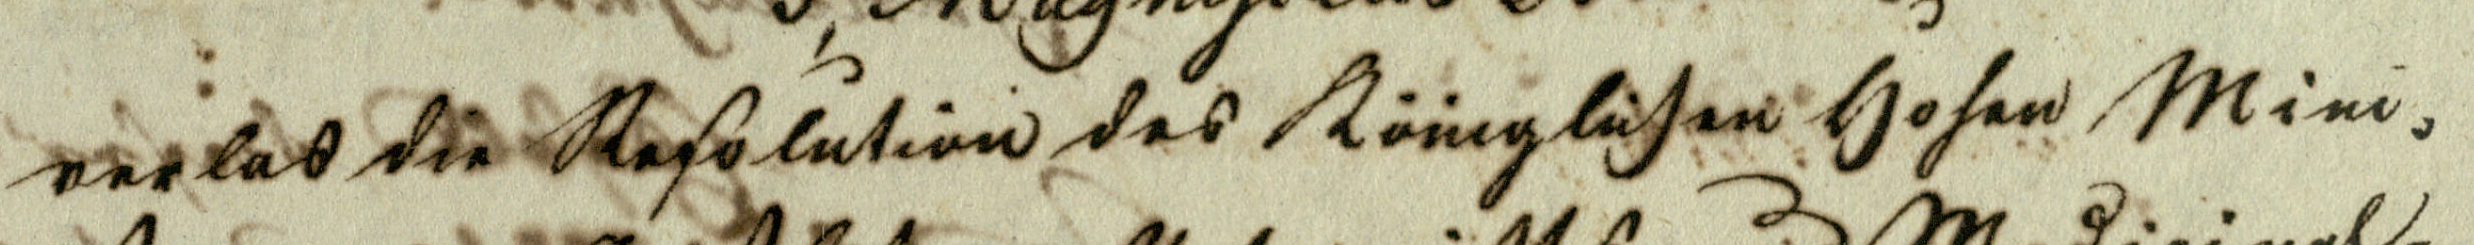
verlas die Resolution, des Königlichen Hohen Mini¬
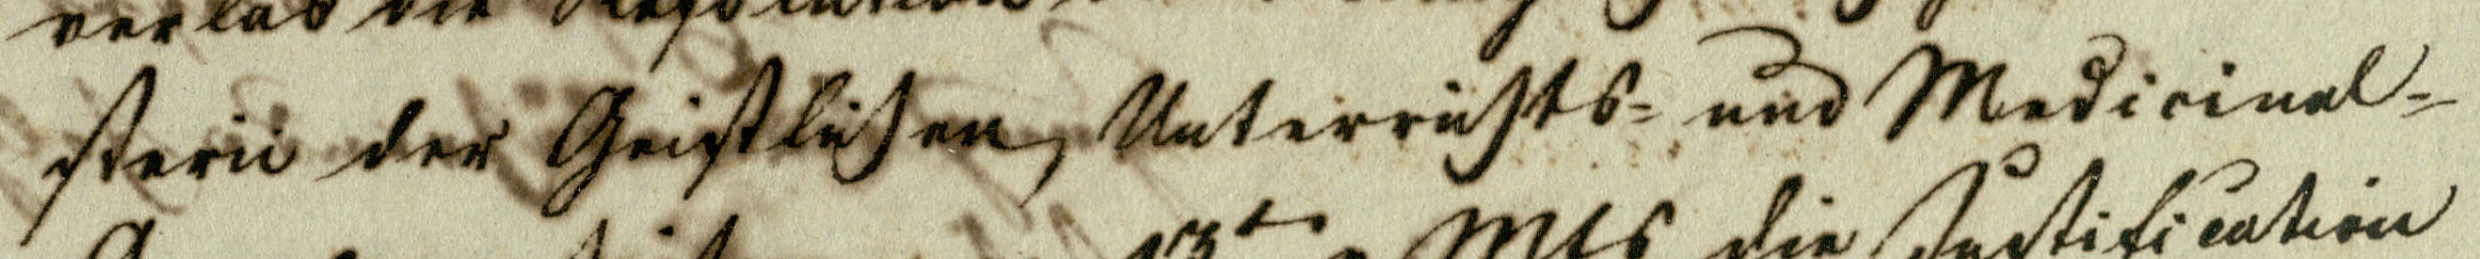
sterii der Geistlichen, Unterrichts und Medicinal¬
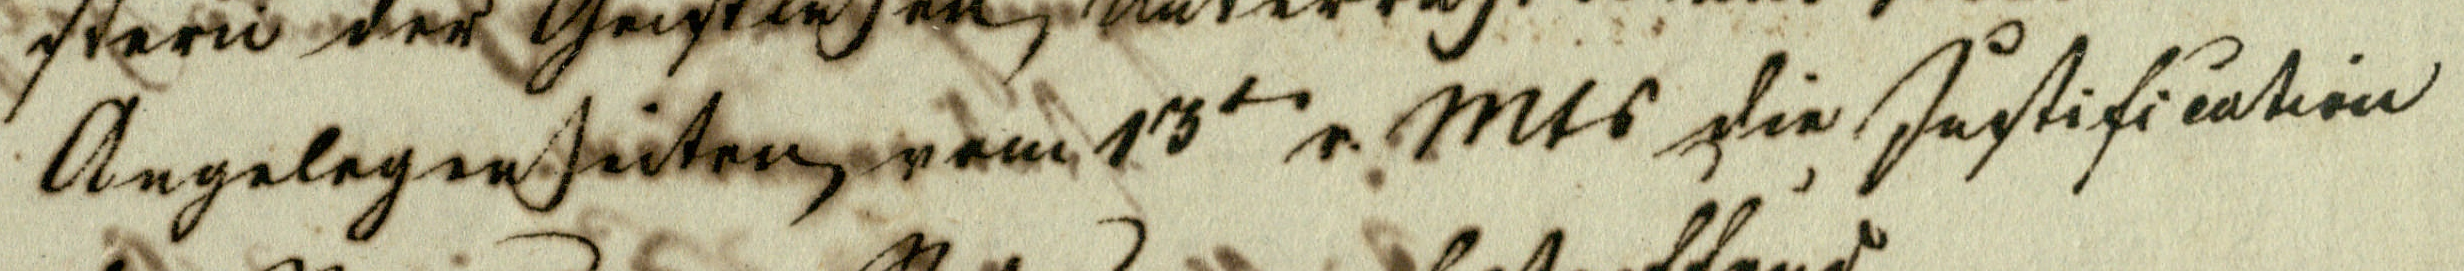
Angelegenheiten vom 13 ten v. Mts. die Justification
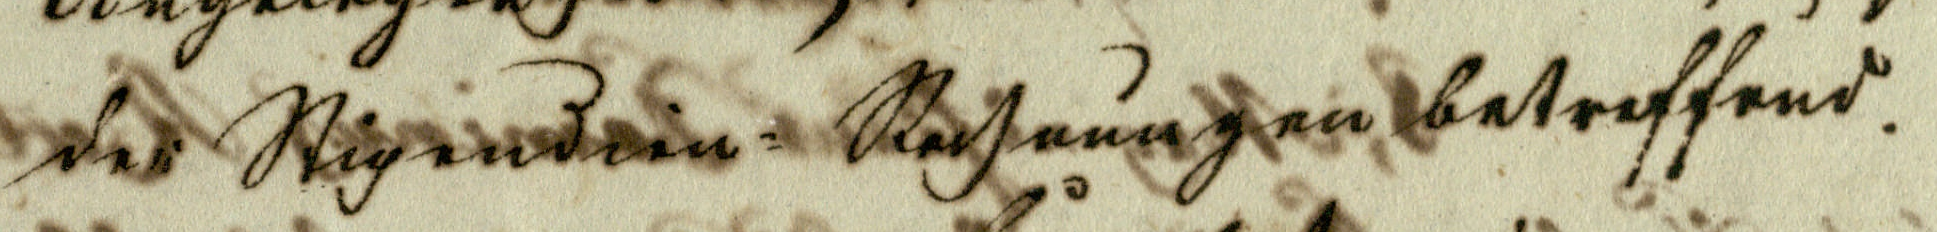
der Stipendien - Rechnungen betreffend.
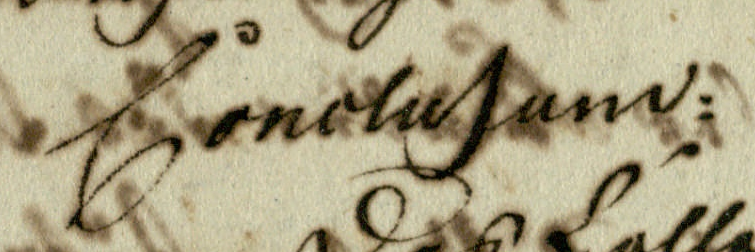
Conclusum:
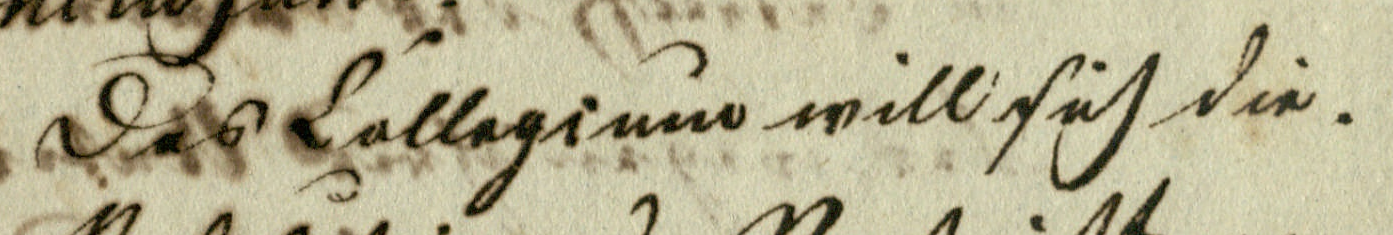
Das Collegium will sich die¬
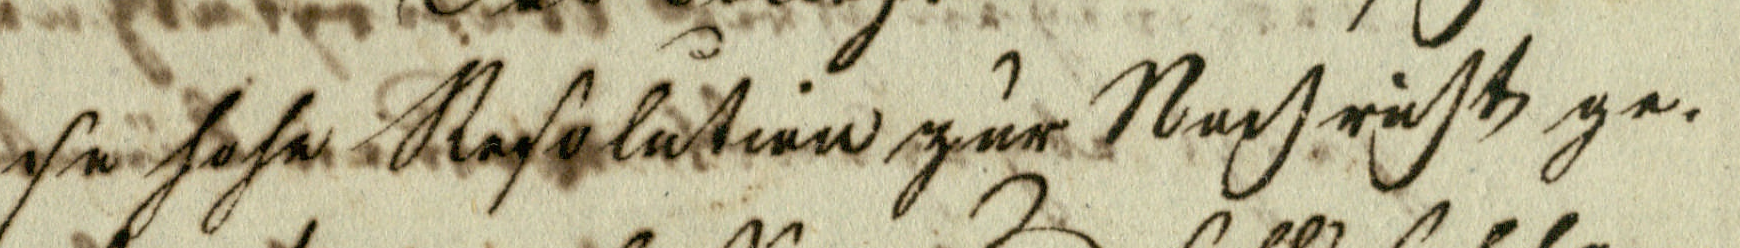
sse hohe Resolution zur Nachricht ge¬
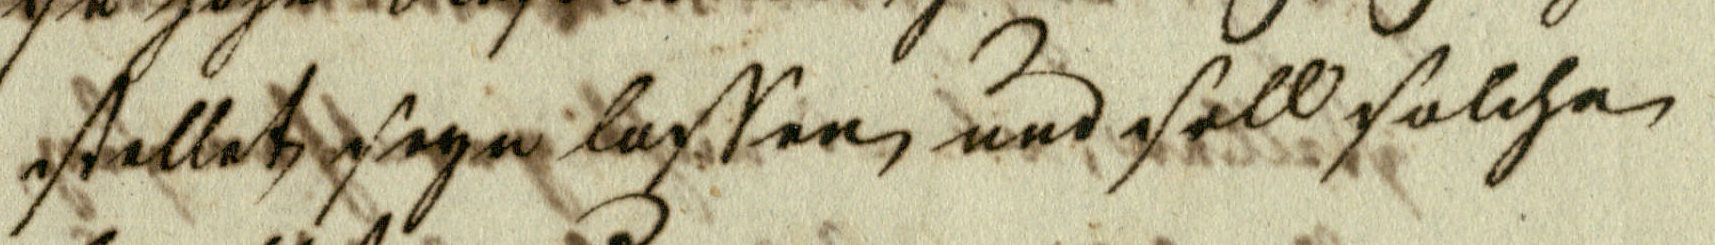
stellet seyn lassen und soll solche
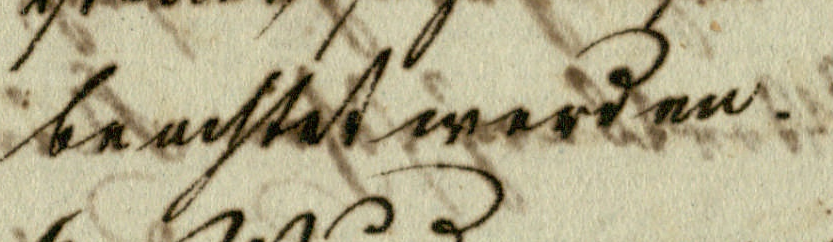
beachtet werden.
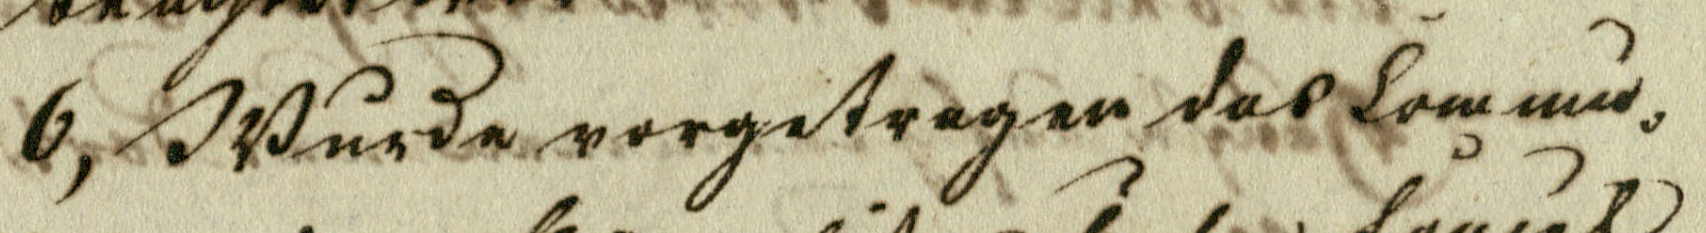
6, Wurde vorgetragen das Comu¬
